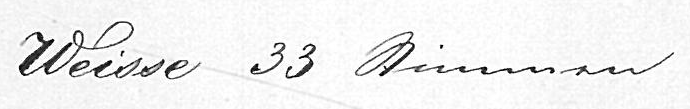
Weise 33 Stimmen
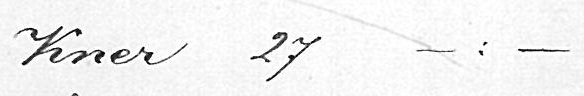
Kner 27 - : -
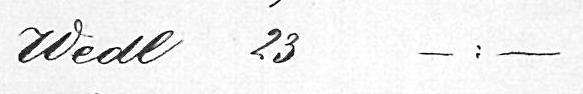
Wedl 23 - : -
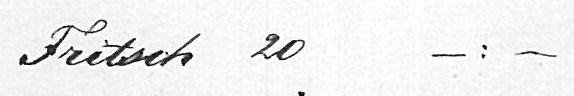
Fritsch 20 - : -
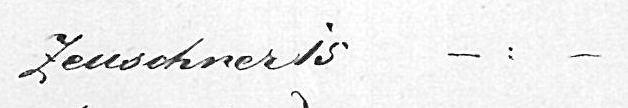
Zeuschner 15 - : -
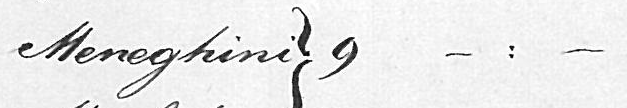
Meneghini 9 - : -
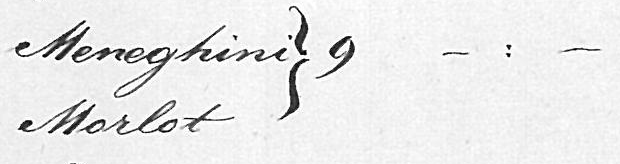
Morlot 9 - : -
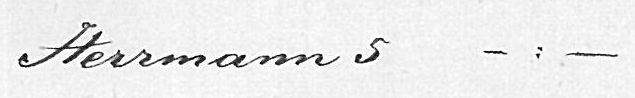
Hermann 5 - : -
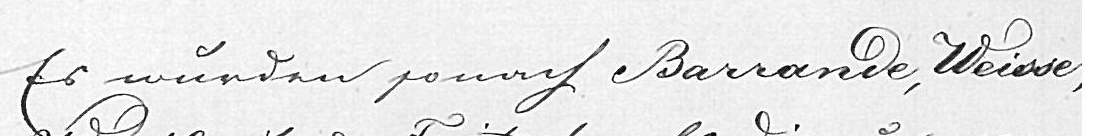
Es wurden sonach Barrande, Weisse,
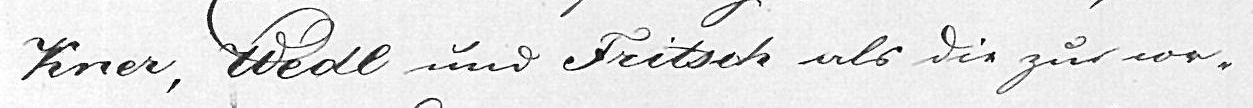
Kner, Wedl und Fritsch als die zu cor-
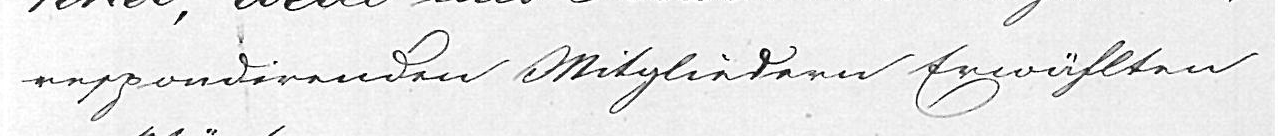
respondirenden Mitgliedern Erwählten
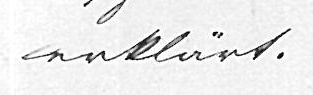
erklärt.
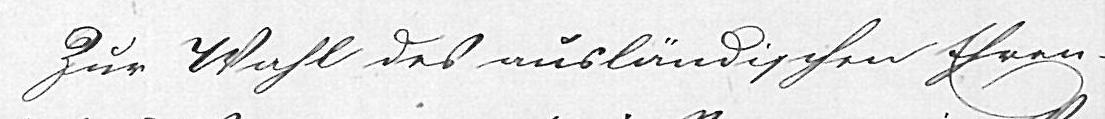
Zur Wahl des ausländischen Ehren
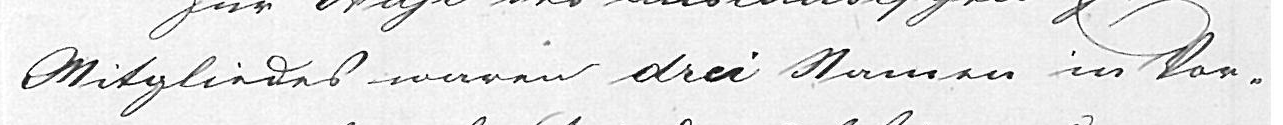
Mitgliedes waren drei Namen in Vor-
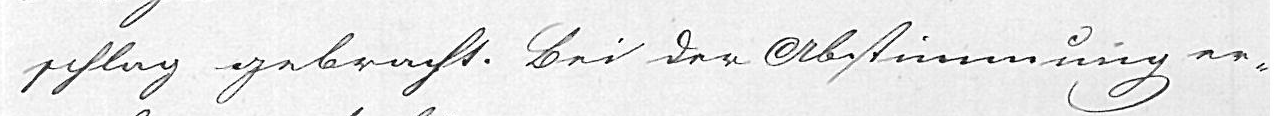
schlag gebracht. Bei der Abstimmung er-
